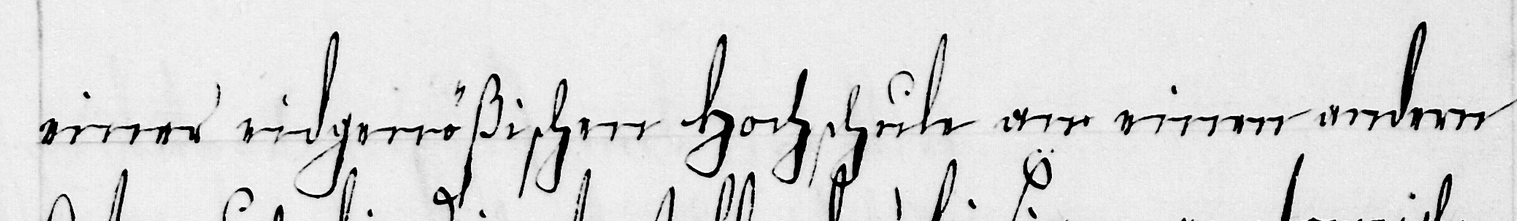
einer eidgenößischen Hochschule an einen andern
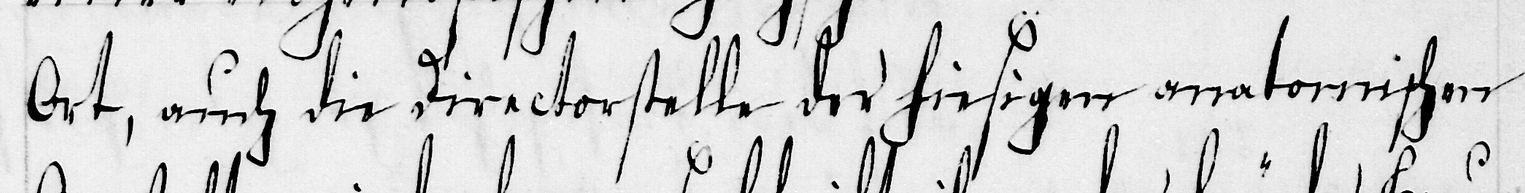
Ort, auch die Directorstelle der hiesigen anatomischen
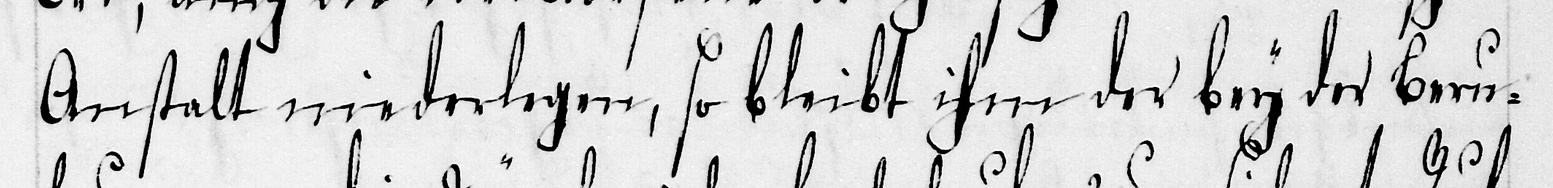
Anstalt niederlegen, so bleibt ihm der bey der Beru¬
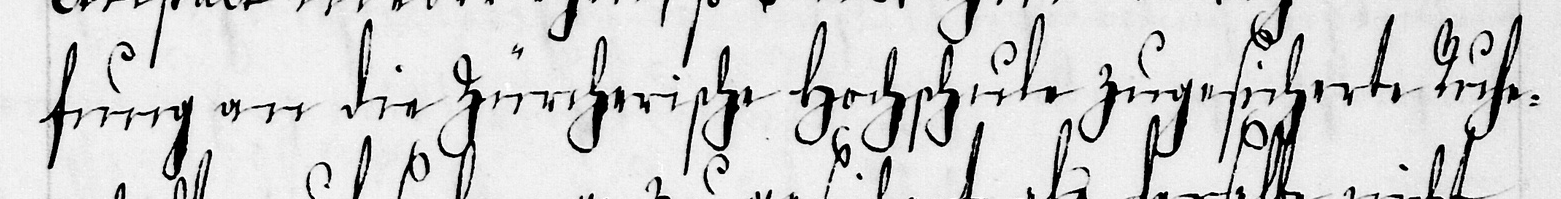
fung an die Zürcherische Hochschule zugesicherte Ruh¬
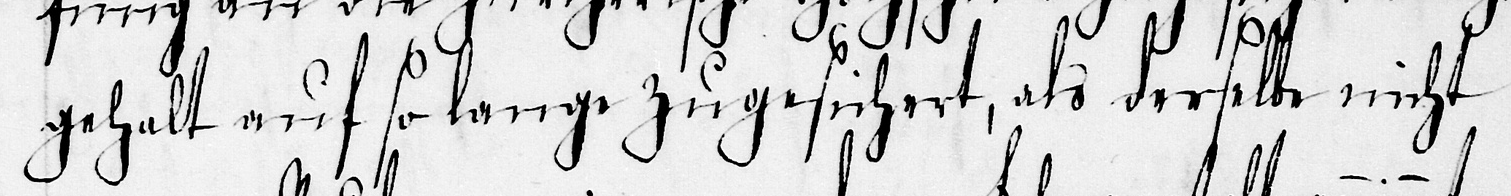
egehalt auf so lange zugesichert, als derselbe nicht
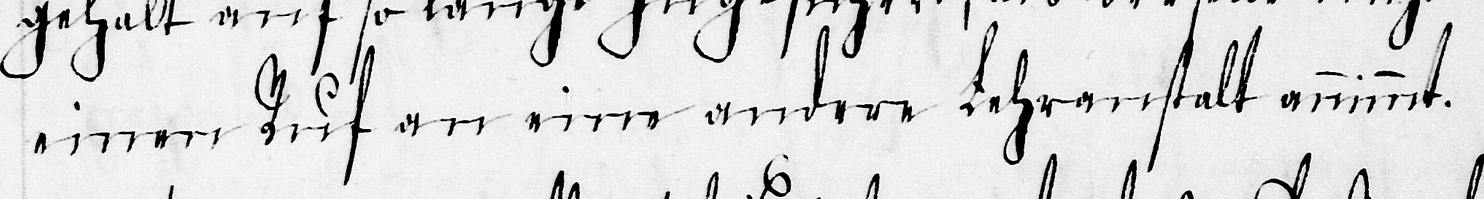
einen Ruf an eine andere Lehranstalt anni¬
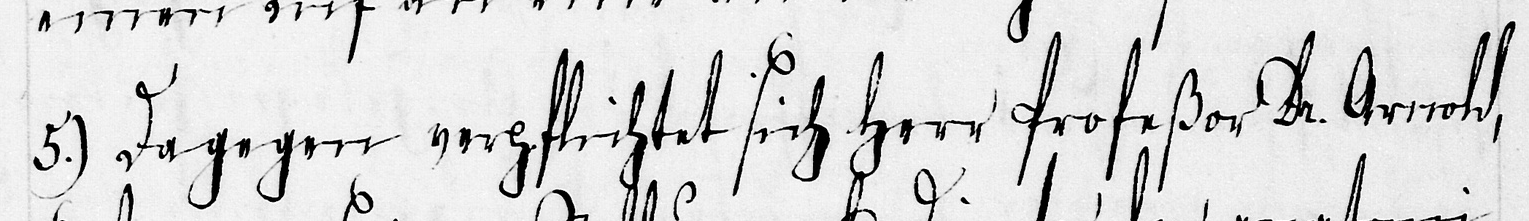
5.) Dagegen verpflichtet sich Herr Profeßor Dr. Arnold,
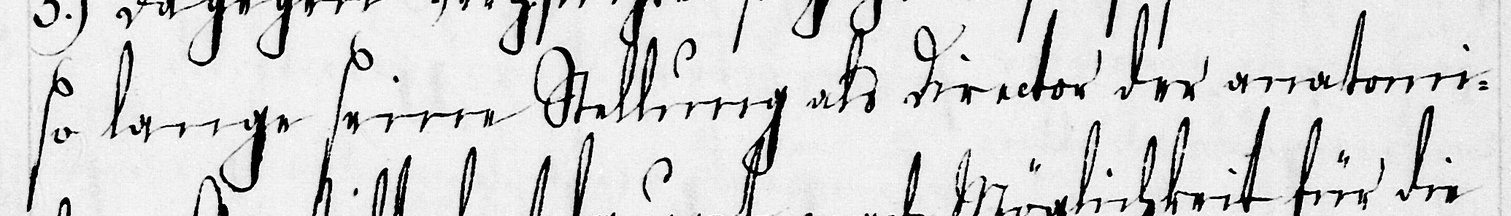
so lange seine Stellung als Director der anatomi¬
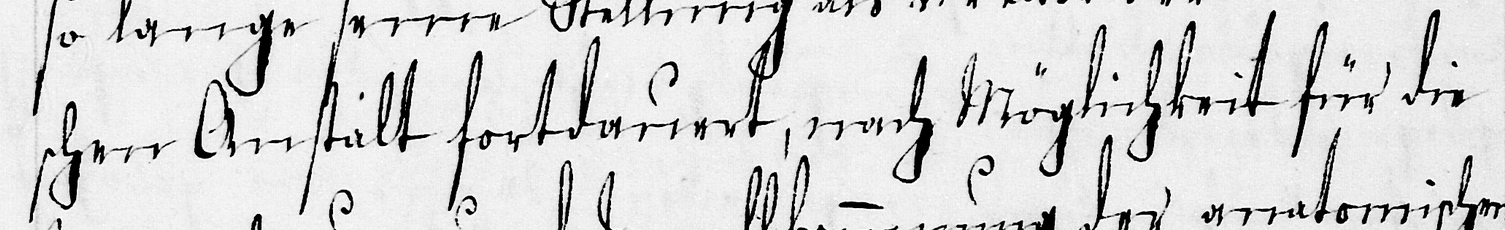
schen Anstalt fortdauert, nach Möglichkeit für die
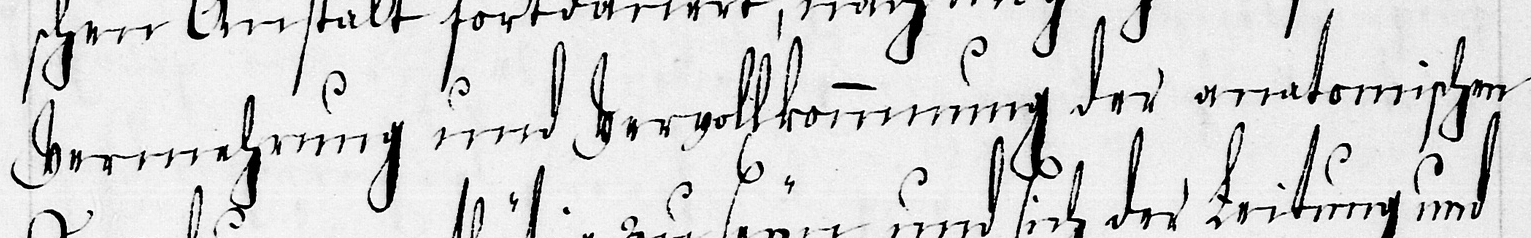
Vermehrung und die Vervollkommnung der anatomischen
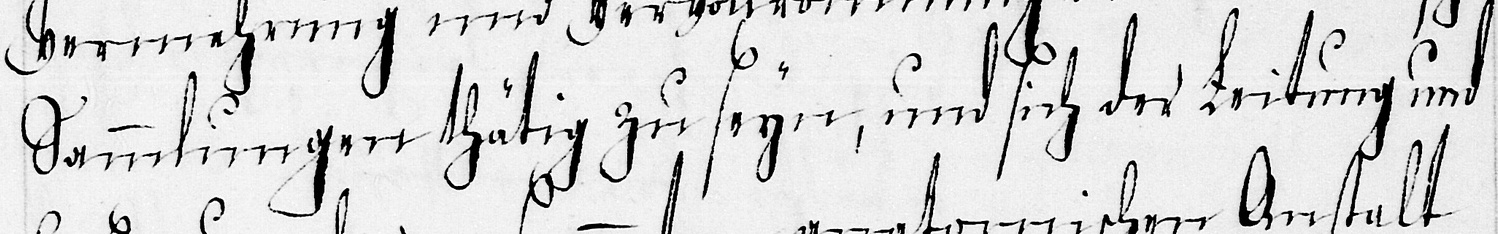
Sammlungen thätig zu seyn, und sich der Leitung und
